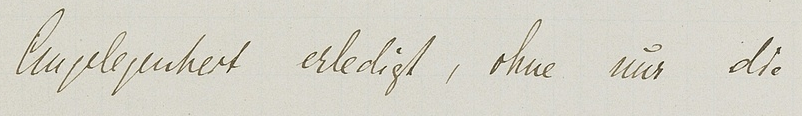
Angelegenheit erledigt, ohne nur die
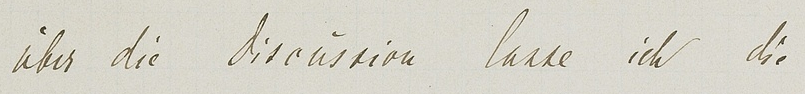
über die Discussion lasse ich die
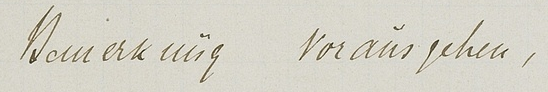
Bemerkung vorausgehen,
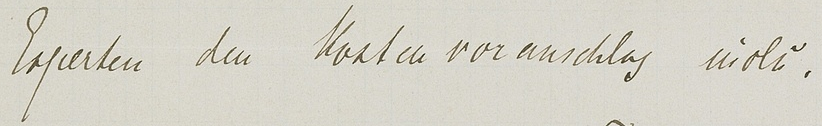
Experten den Kostenvoranschlag inclu-
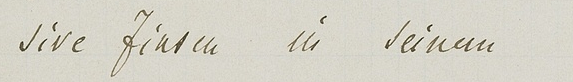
sive Zinsen in seinem
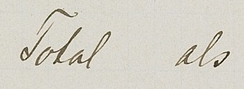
Total als
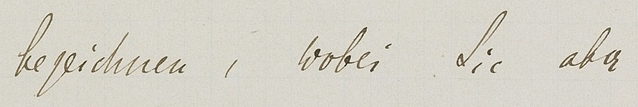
bezeichnen, wobei sie aber
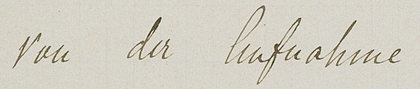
von der Aufnahme eines
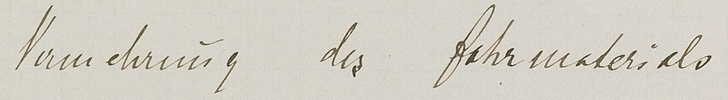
Vermehrung des Fahrmaterials
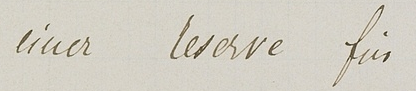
einer Reserve für
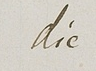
die
